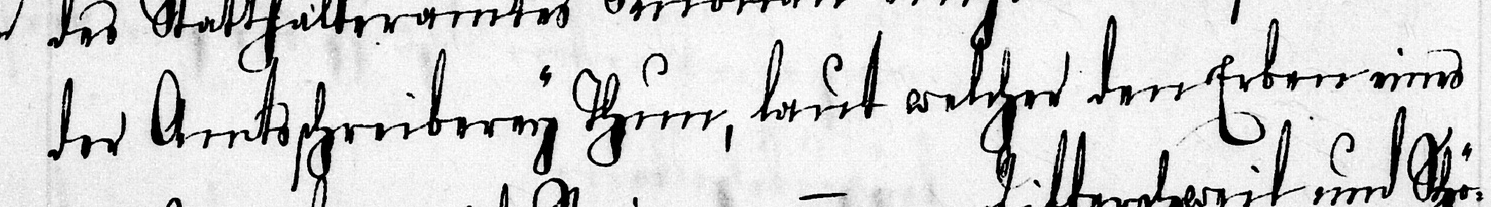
der Amtsschreiberey Thun, laut welcher den Erben eines
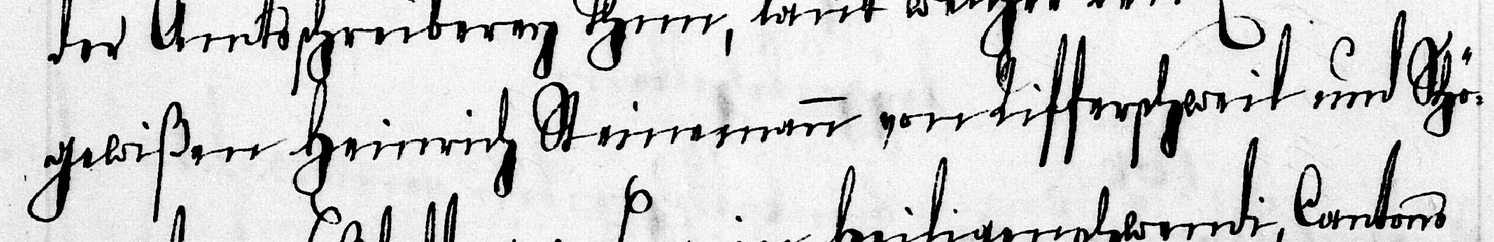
gewißen Heinrich Steinemann von Rifferschweil und Schö¬
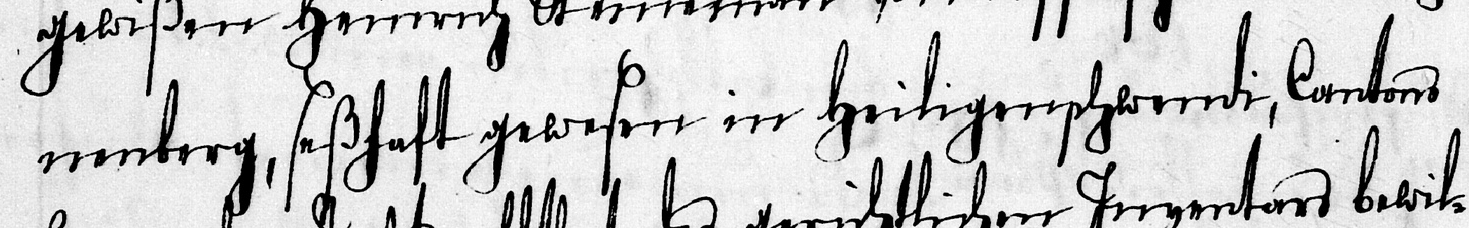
nenberg, seßhaft gewesen in Heiligenschwendi, Cantons
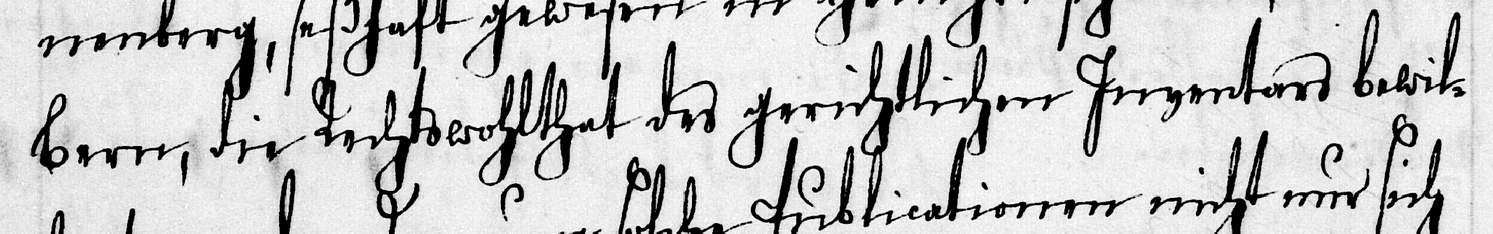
Bern, die Rechtswohlthat des gerichtlichen Inventars bewil¬
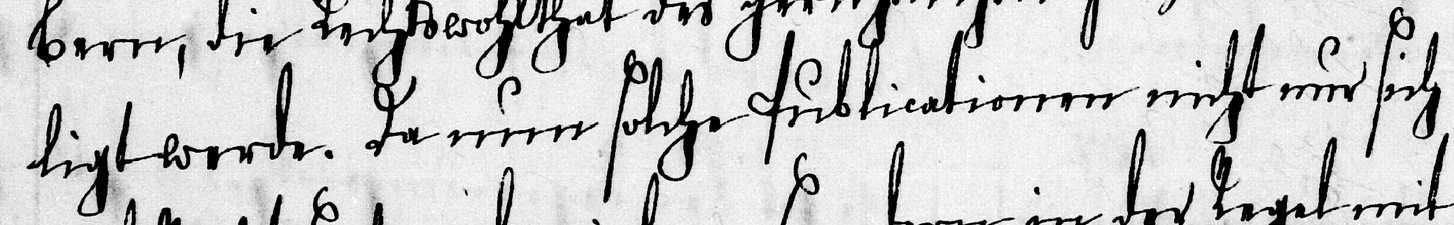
ligt werde. Da nun solche Publicationen nicht nur sich
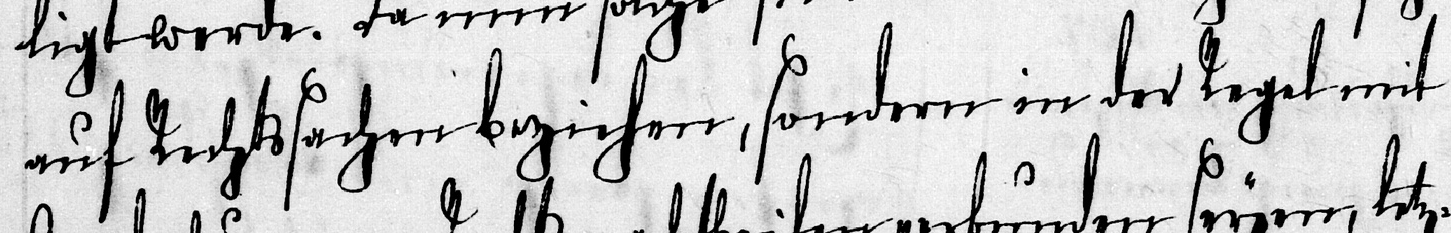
auf Rechtssachen beziehen, sondern in der Regel mit
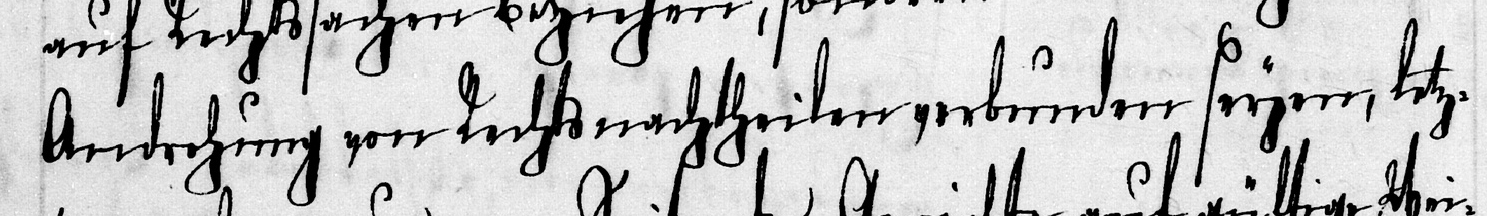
Androhung von Rechtsnachtheilen verbunden seyen, let¬
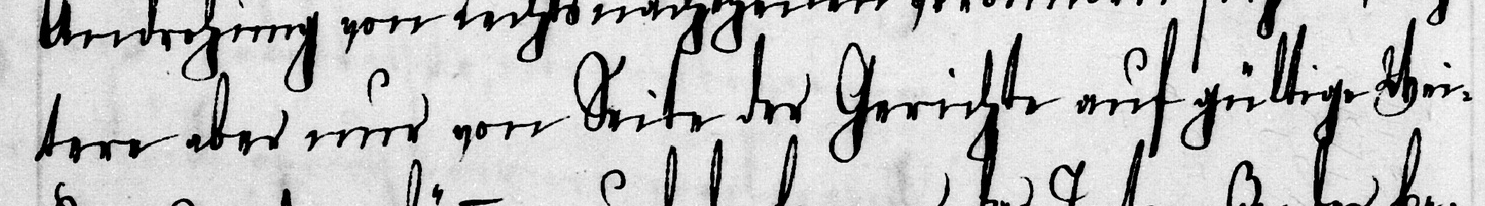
ztere aber nur von Seite der Gerichte auf gültige Wei¬
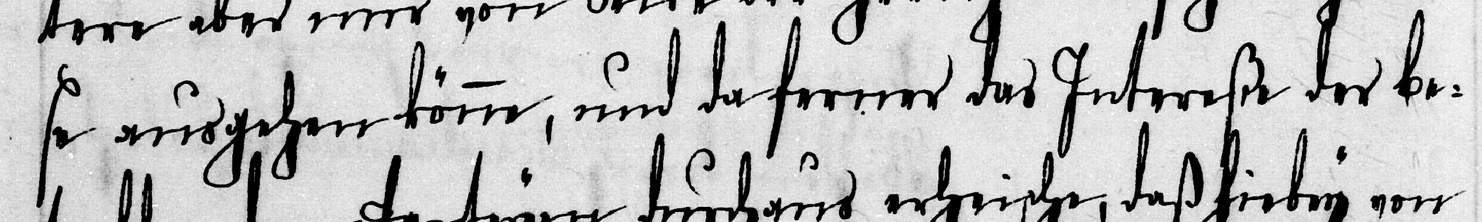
se ausgehen könne, und da ferner das Intereße der be¬
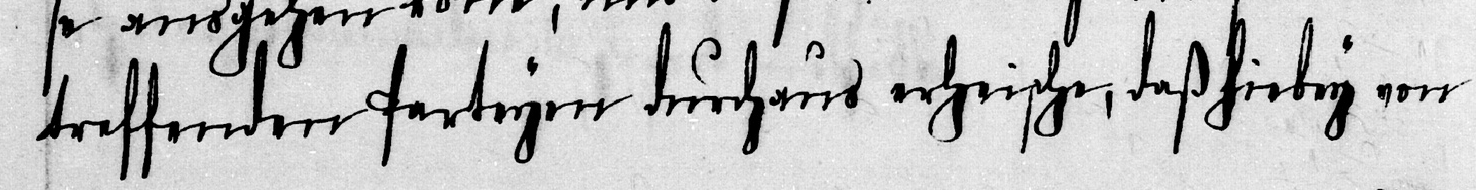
treffenden Parteyen durchaus erheische, daß hiebey von
